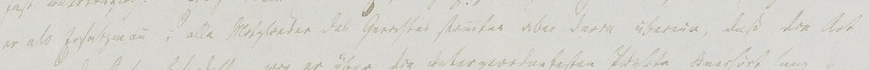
er als Ersatzmann; alle Mitglieder des Gerichtes stimmten aber darin überein, daß die Art
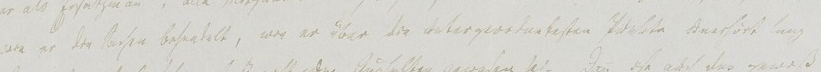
wie er die Sachen behandelt, wie er über die untergeordnetesten Punkte unerhört lang
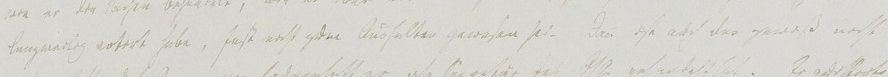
langweilig votirt habe, fast nicht zum Aushalten gewesen sei. Dann ist auch das gewiß nicht
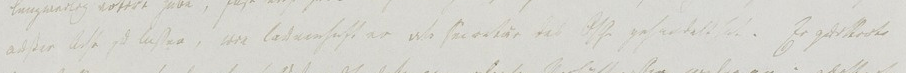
außer Acht zu lassen, wie launenhaft er als Secretär desO.G. gehandelt hat. Er quittirte
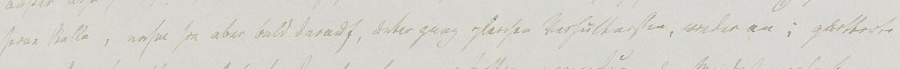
seine Stelle, nahm sie aber bald darauf, unter ganz gleichen Verhältnissen, wieder an; quittirte
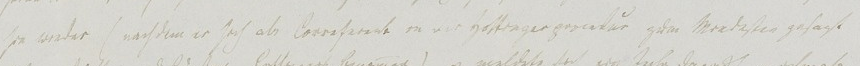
sie wieder (nachdem er sich als Correferent in der Hottingerprocedur zum Mindesten gesagt
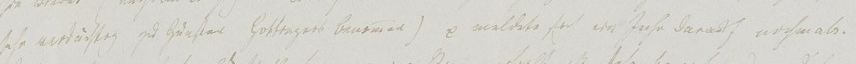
sehr verdächtig zu Gunsten Hottingers benommen) & meldete sich ein Jahr darauf nochmals.
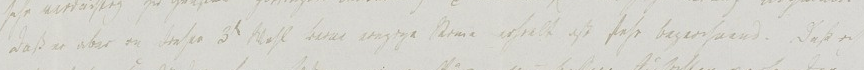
Daß er aber in dieser 3ten Wahl keine einzige Stimme erhielt ist sehr bezeichnend. Daß ich
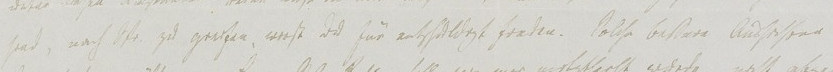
sind, nach Spr. zu greifen, wirst Du für entschuldigt finden. Solche besseren Aussichten
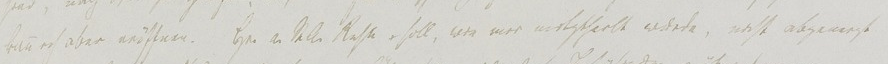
kann ich aber eröffnen. Hr. a. StA. Rahn soll, wie mir mitgetheilt wurde, nicht abgeneigt
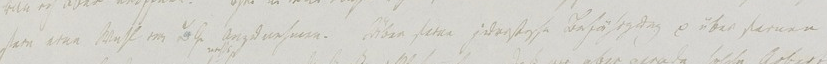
sein eine Wahl ins BG anzunehmen. Über seine juristische Befähigung & über seinen
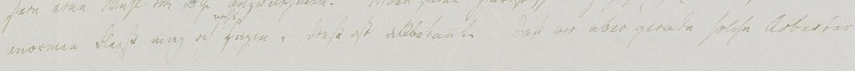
enormen Fleiß mag ich nichts sagen, dieß ist allbekannt. Daß wir aber gerade solche Arbeiter
